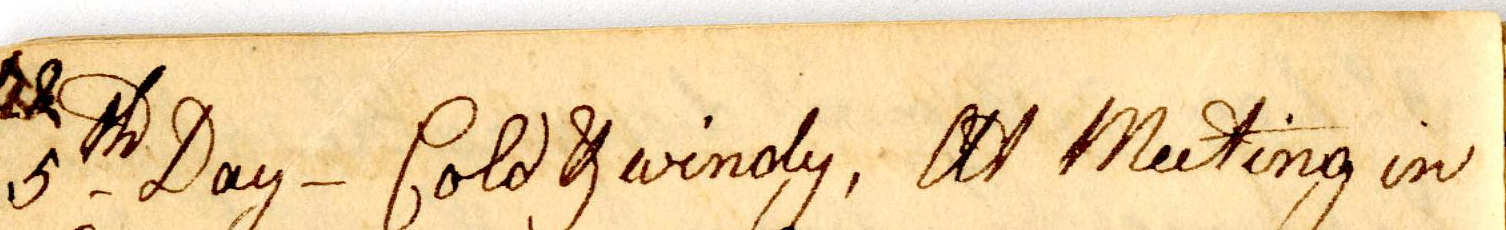5^th Day- Cold & windy, At Meeting in
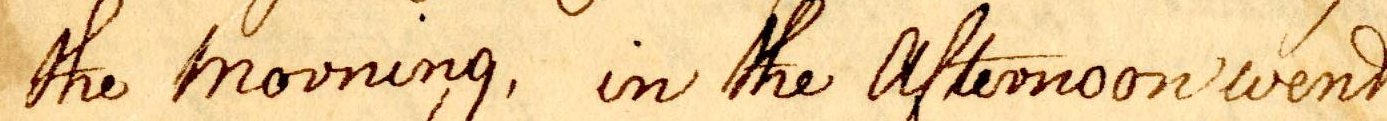the morning, in the Afternoon went
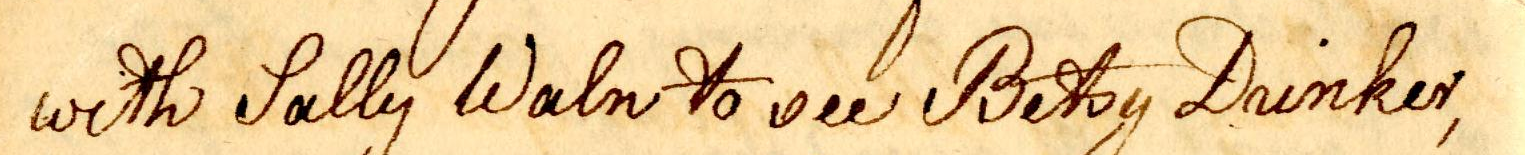with Sally Waln to see Betsy Drinker,
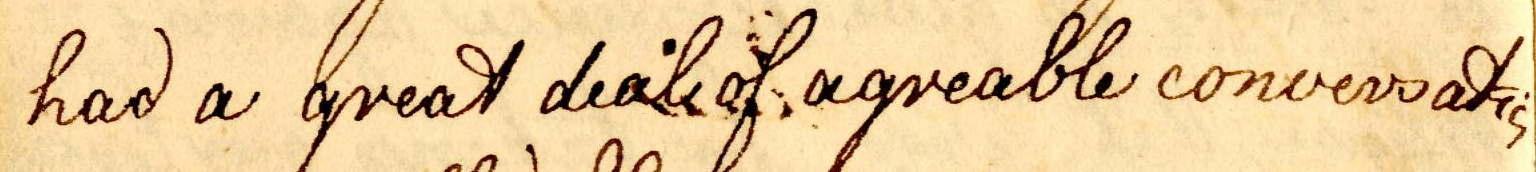had a great deal of agreable conversatio
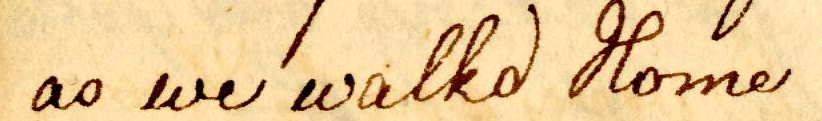as we walkd Home
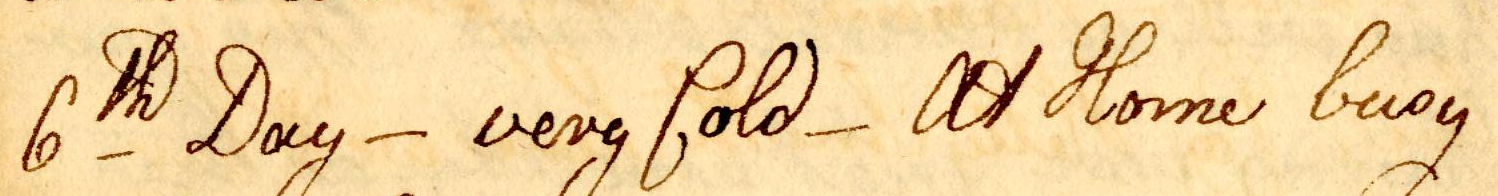6^th Day- very Cold- At Home busy
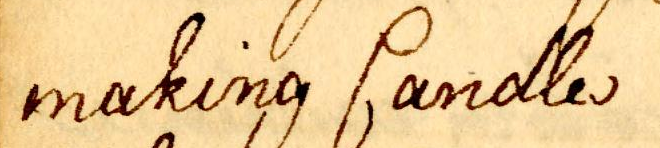making Candles
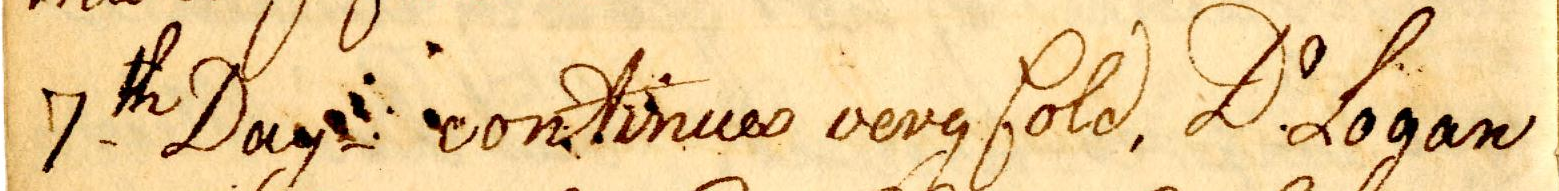7^th Day- continues very Cold, D^r. Logan
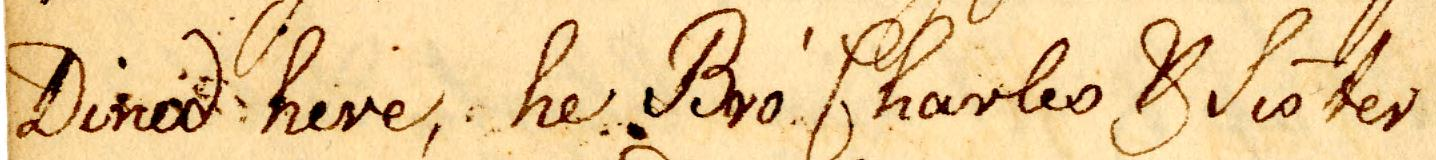Dined here, he Bro' Charles & Sister
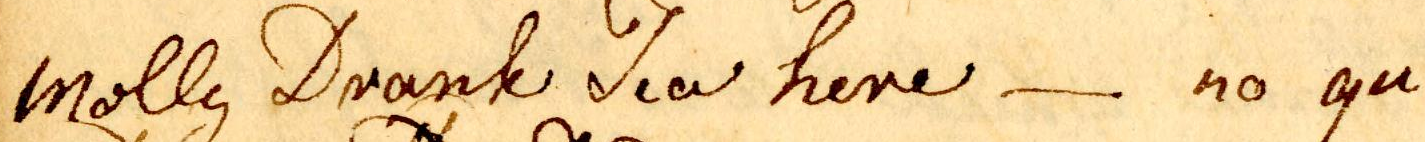Molly Drank Tea here- no qu
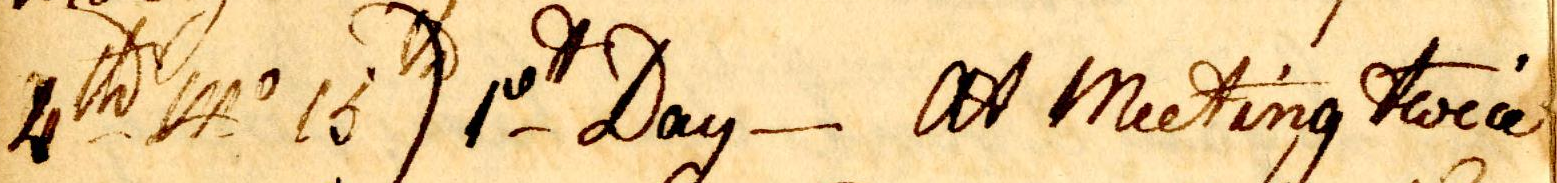4^th M^o 15^th) 1^st Day- At Meeting twice
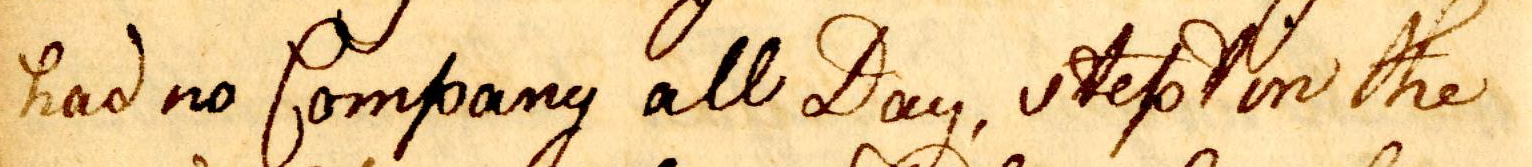had no Company all Day, stept in the
